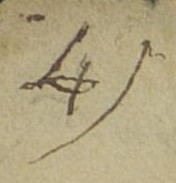4
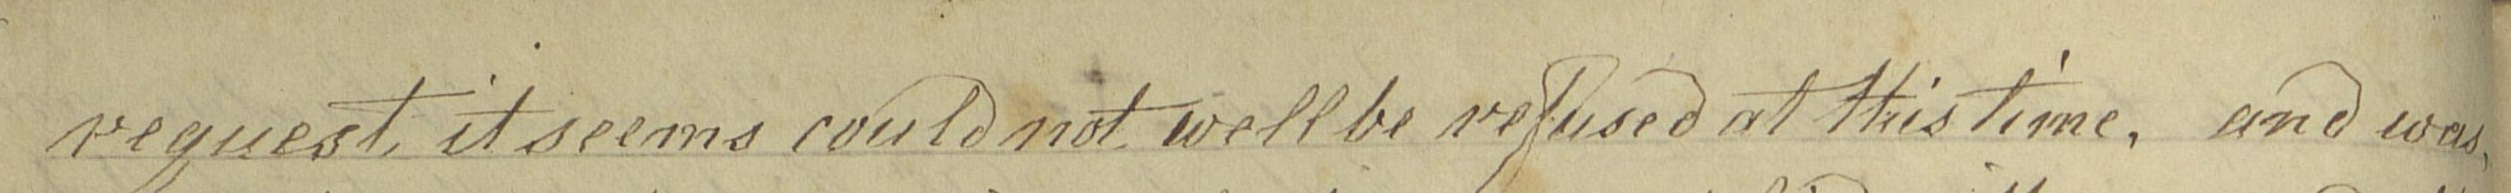request it seems could not well be refused at this time, and was
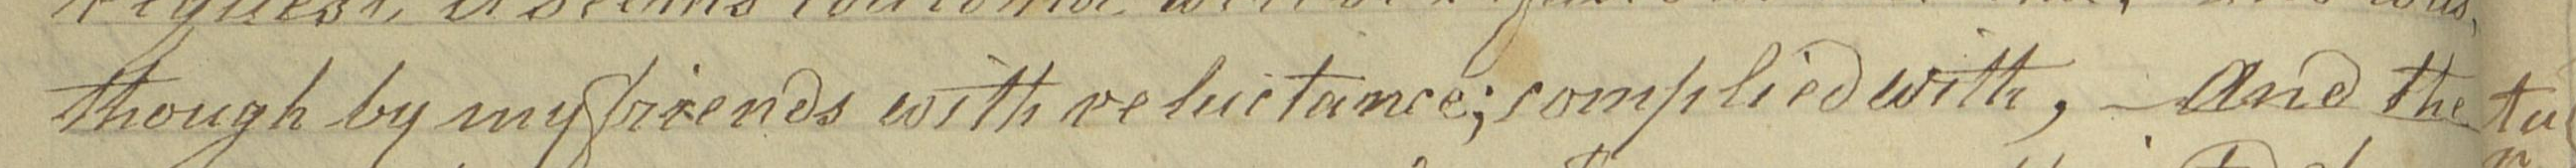though by my friends with reluctance; complied with,- And the
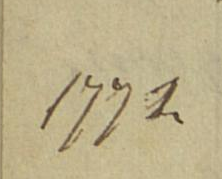1772
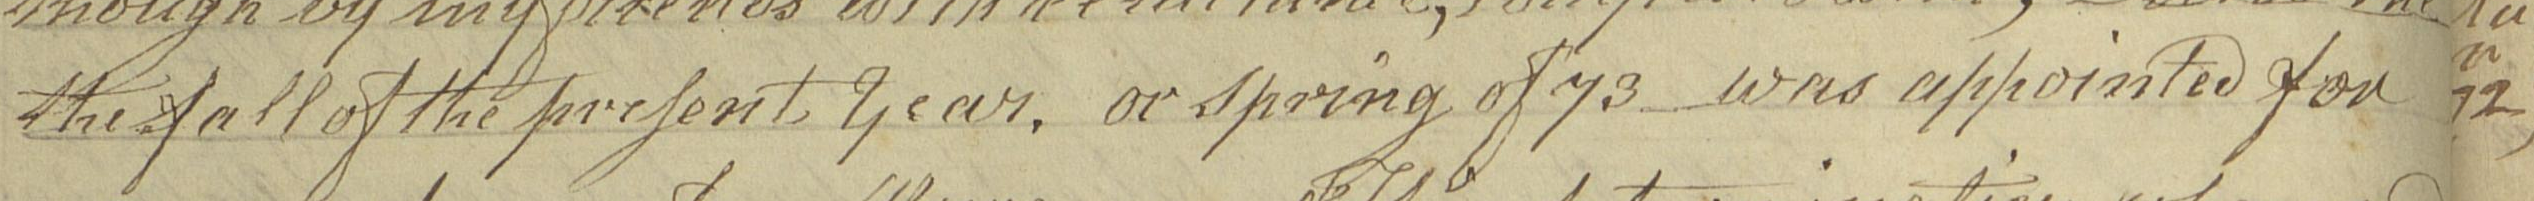the fall of the present year, or spring of 73 was appointed for
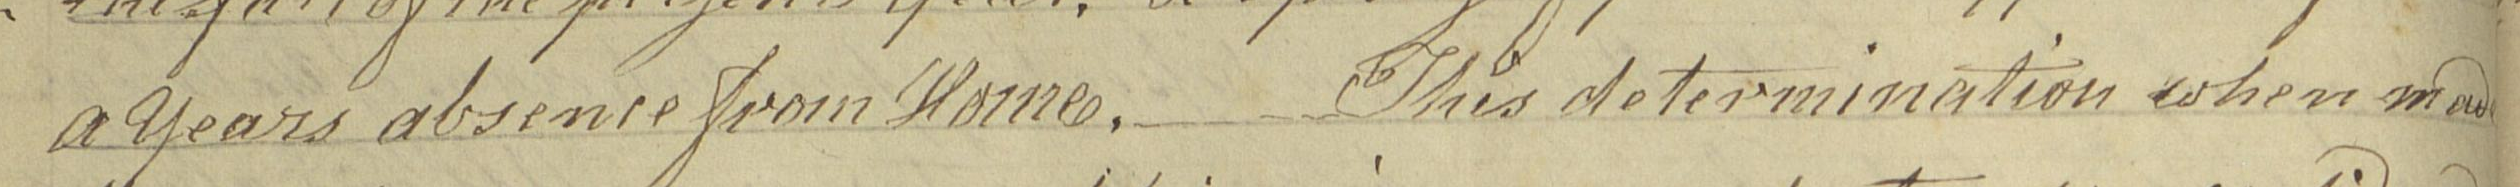a Years absence from Home. This determination when made
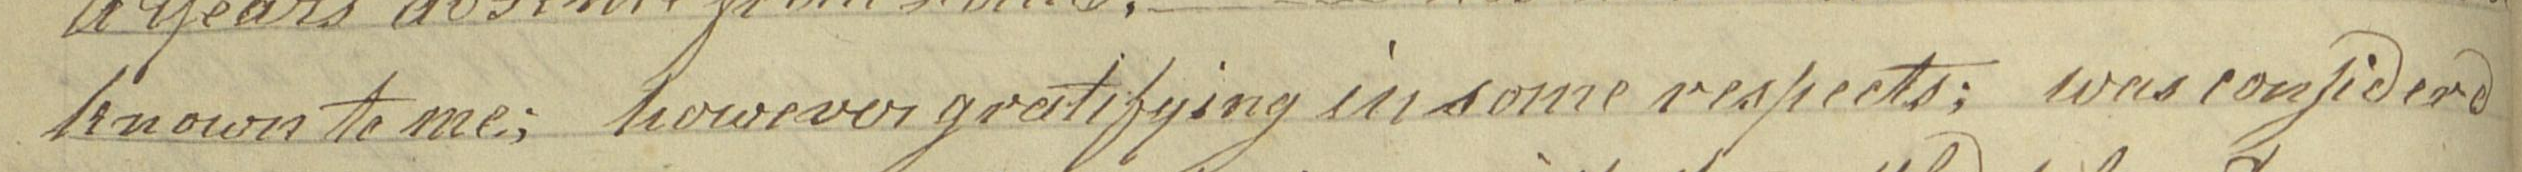known to me; however gratifying in some respects; was considerd
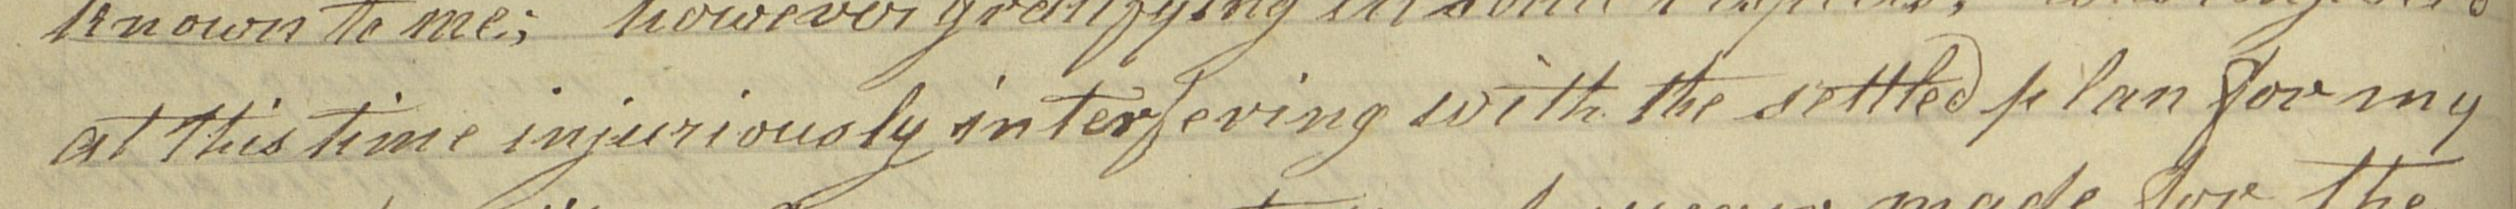at this time injuriously interfering with the settled plan for my
